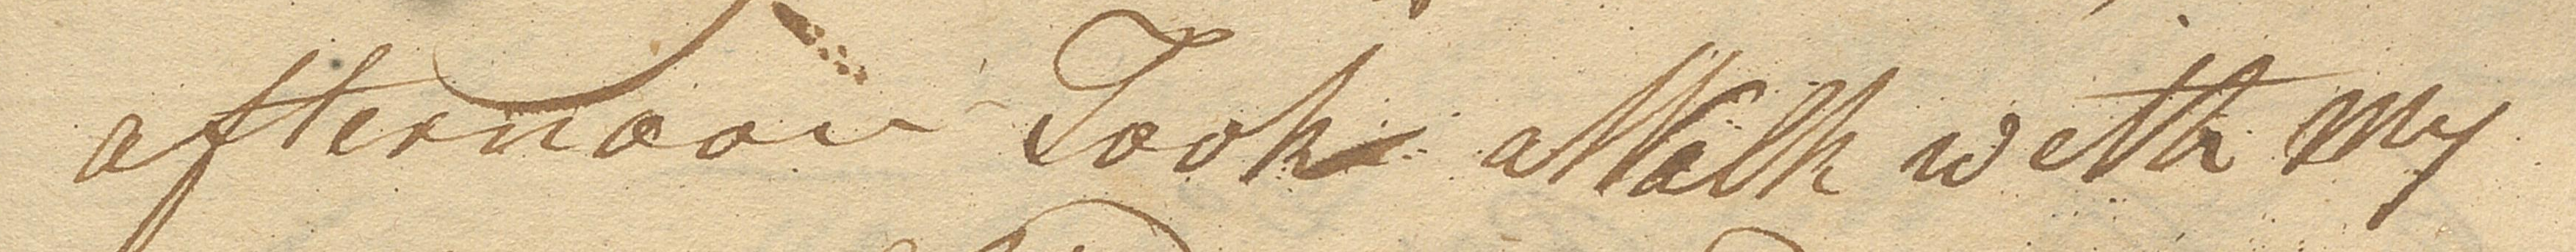afternoon Took a Walk with My
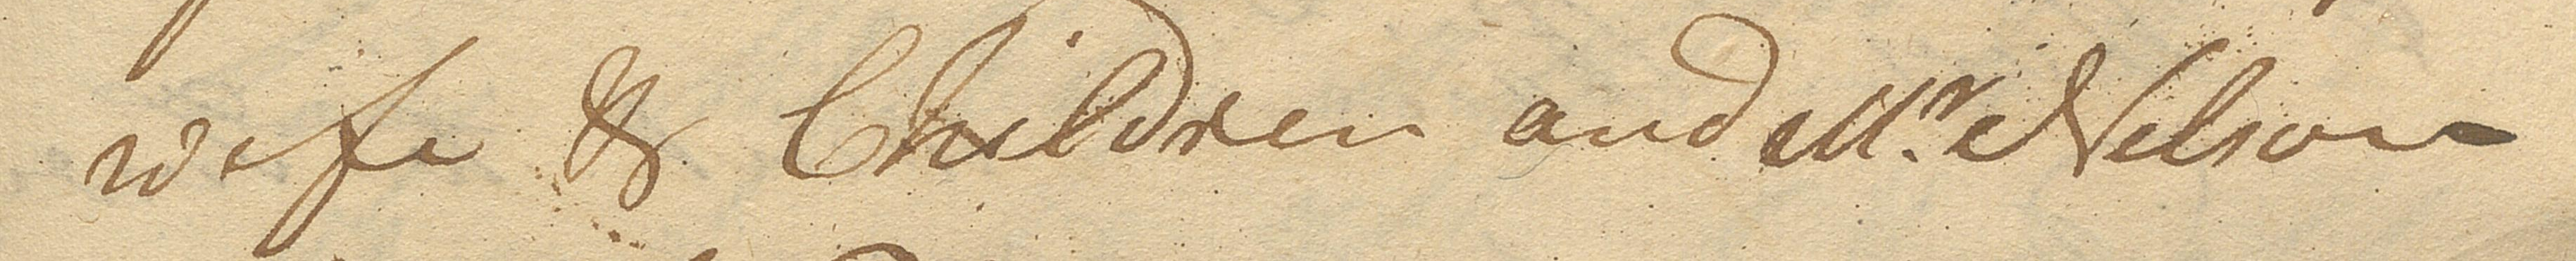wife & Children and M^r. Nelson
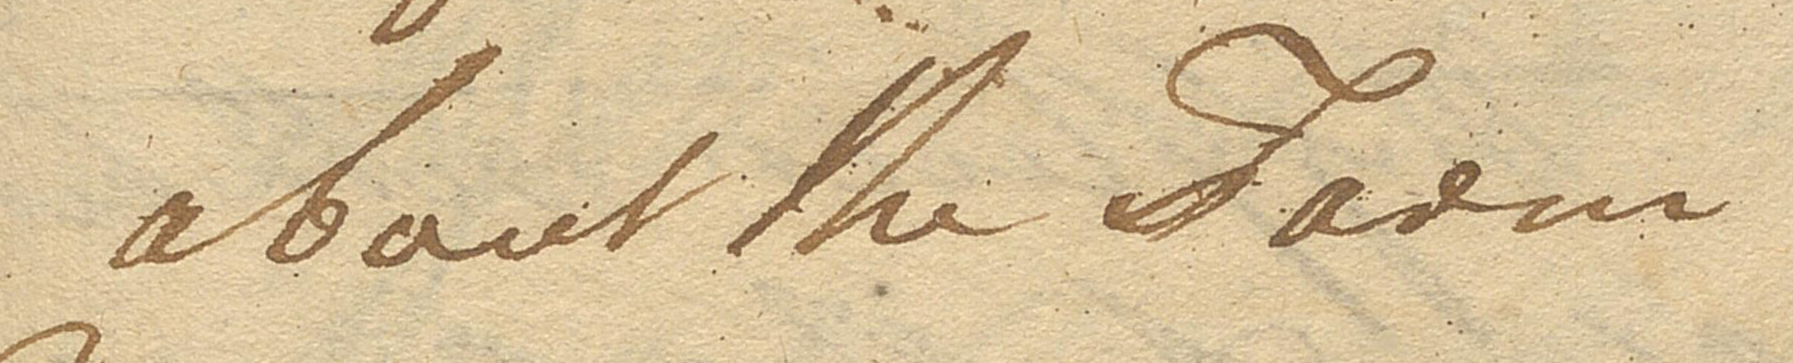about the Tarm
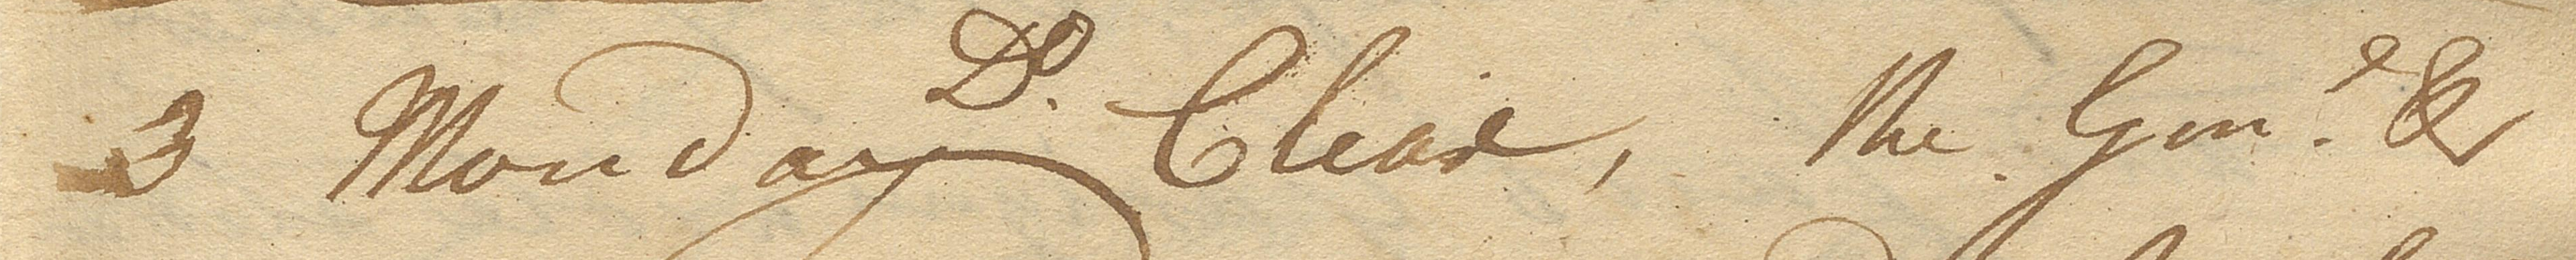3 Monday Clear, the Gen^l. &
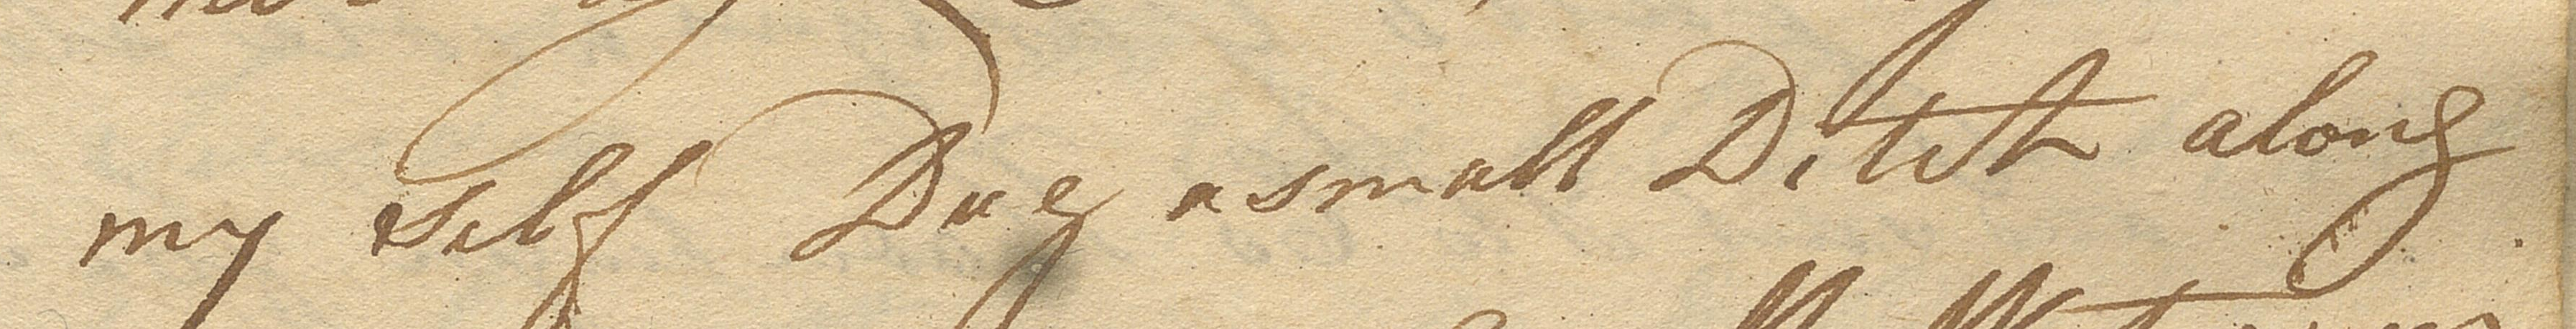my self Dug a small Ditch along
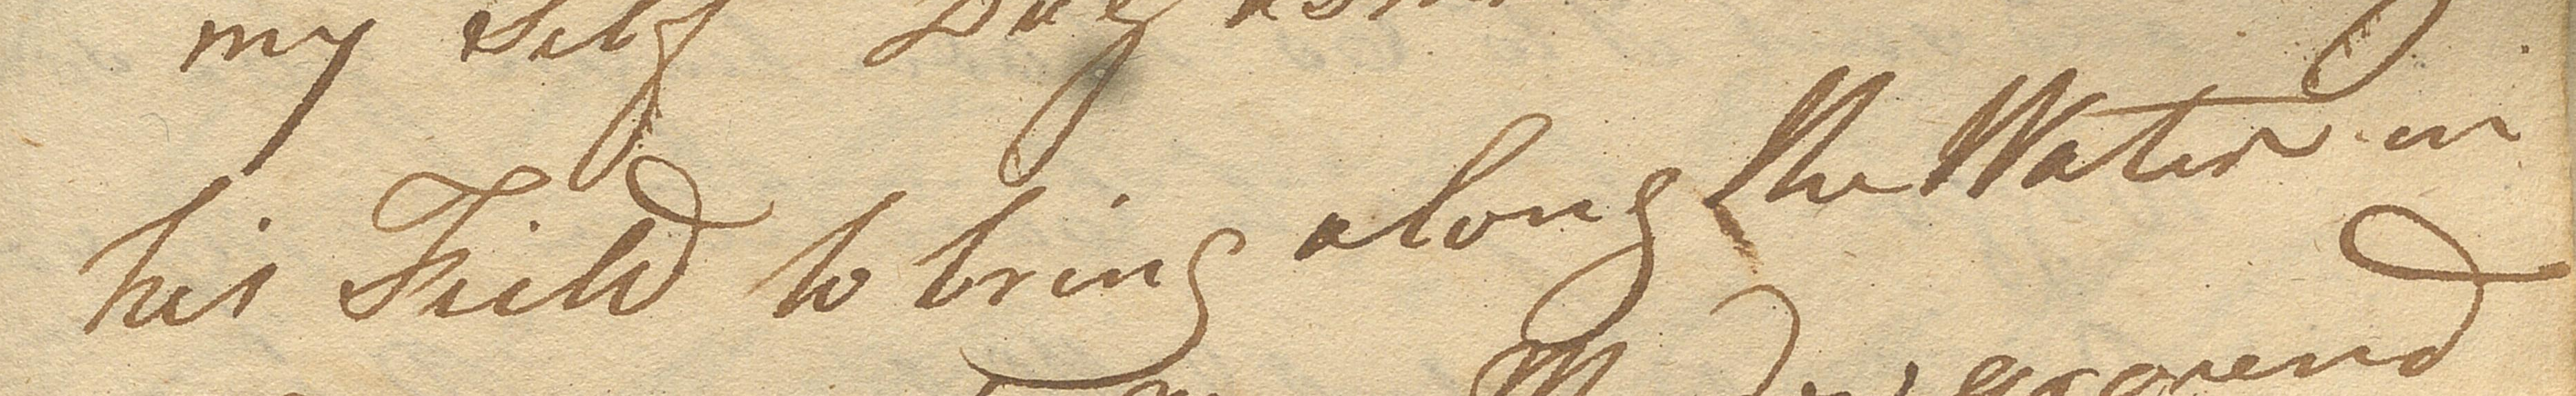his Field to bring along the Waters in
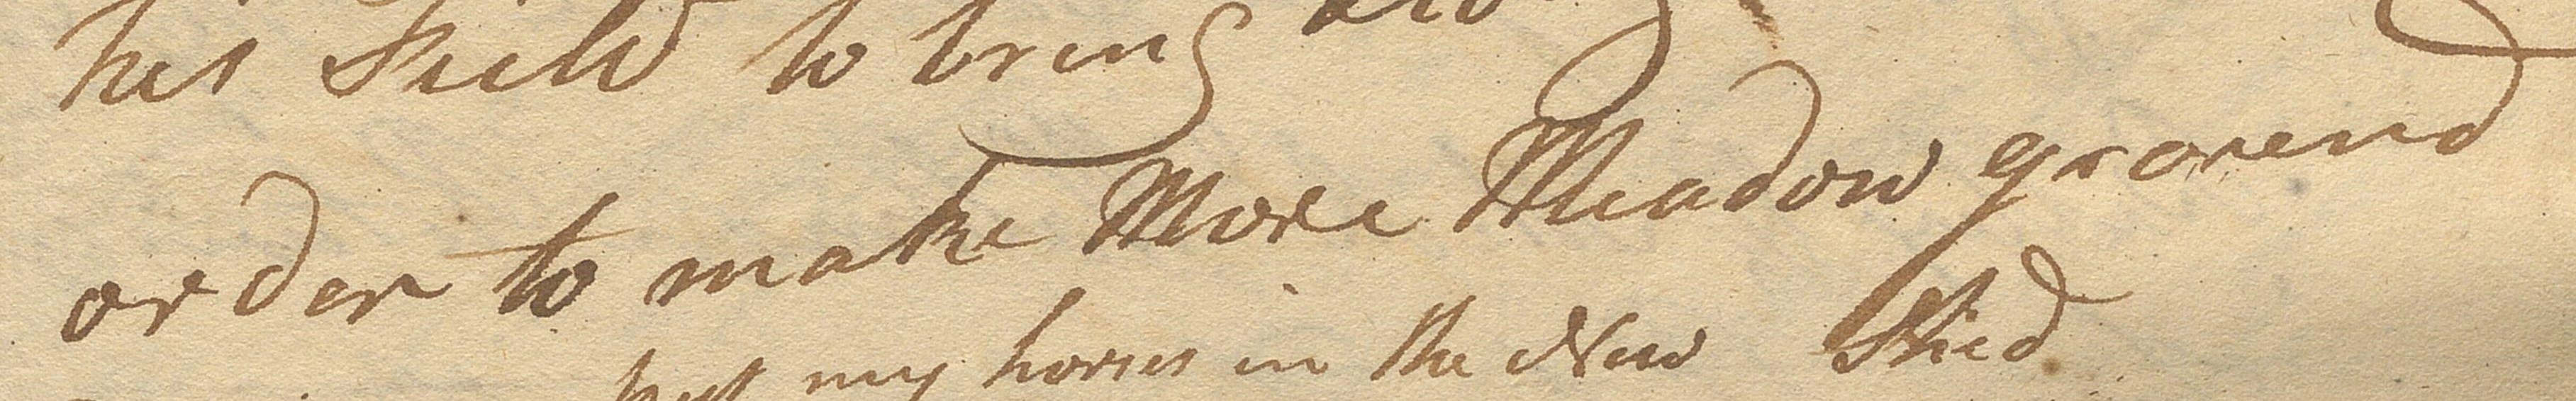order to make More Meadow grovend
